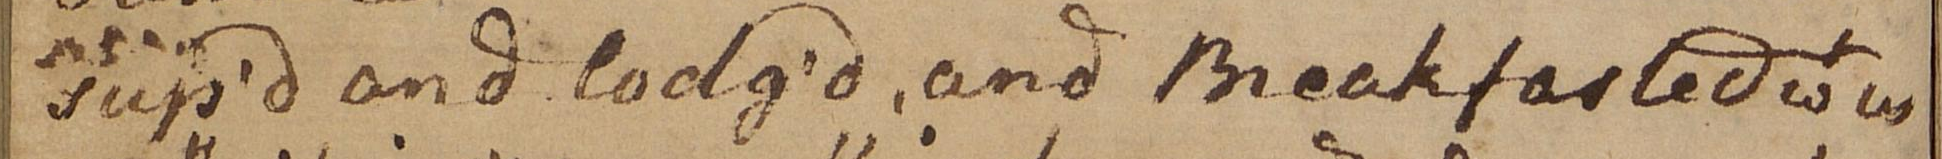sup'd and lodg'd, and Breakfasted w^t us
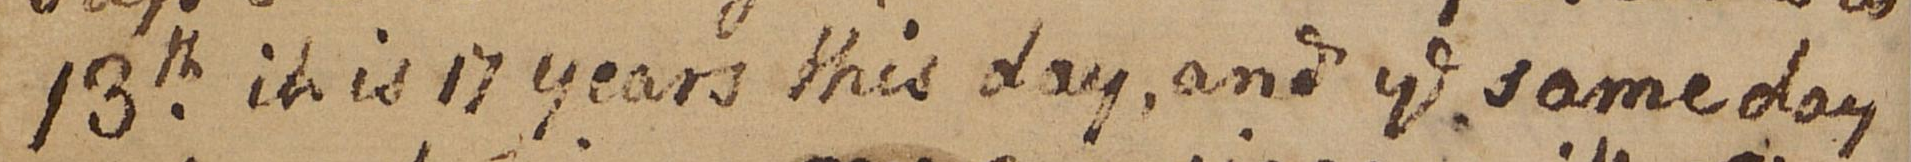13^th. it is 17 years this day, and y^e same day
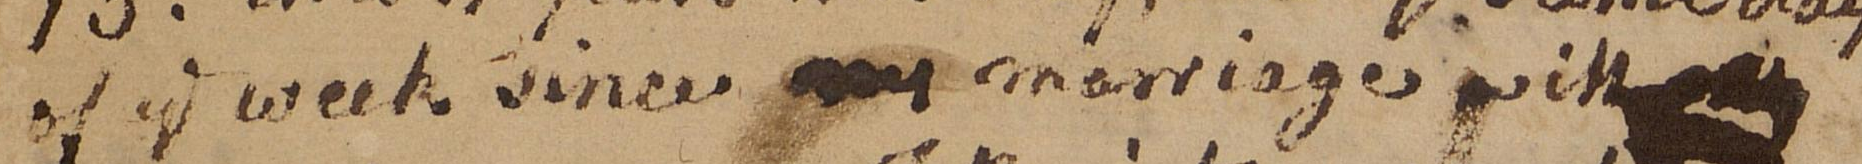of y^e week since my marriage with [___]
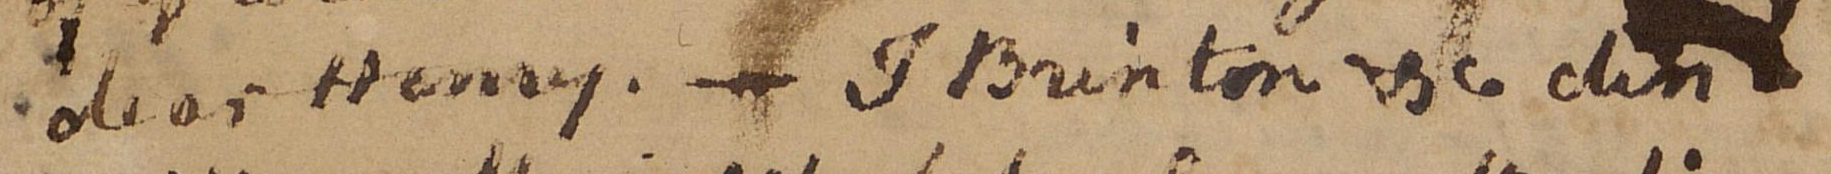dear Henry. - J Brinton &c din
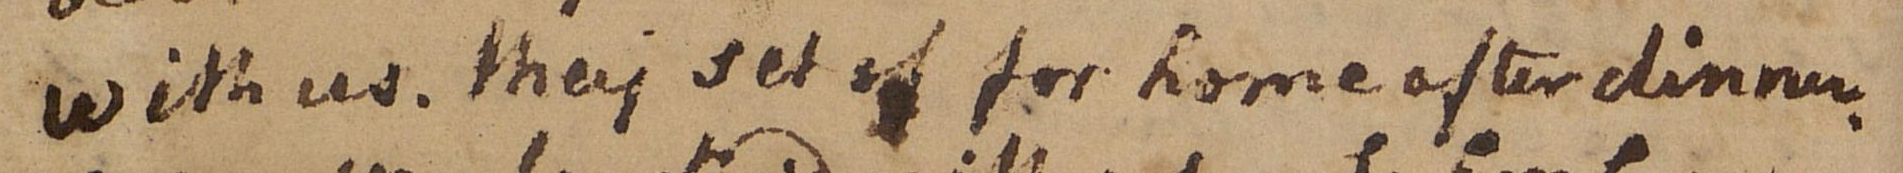with us. they set of for home after dinner.
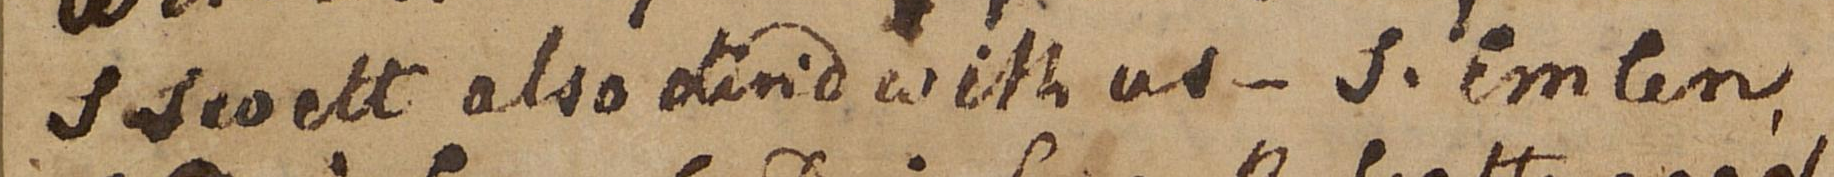S Swett also din'd with us- S. Emlen,
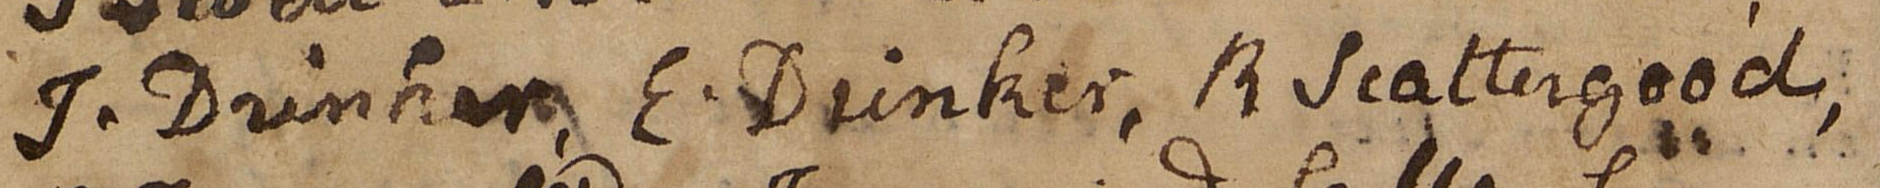I. Drinker, E. Drinker, R Scattergood,
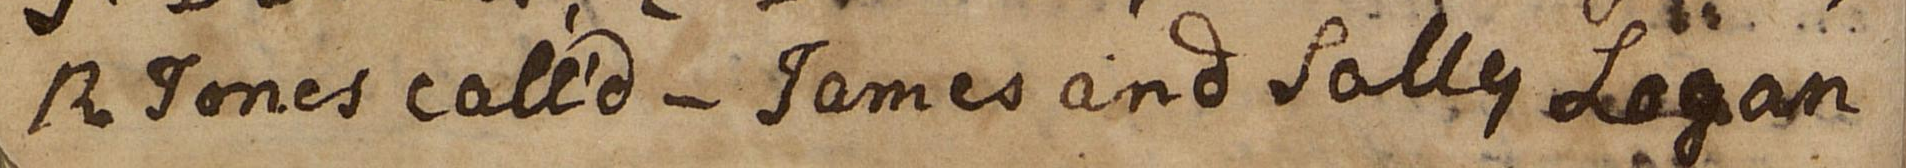R Jones call'd- James and Sally Logan
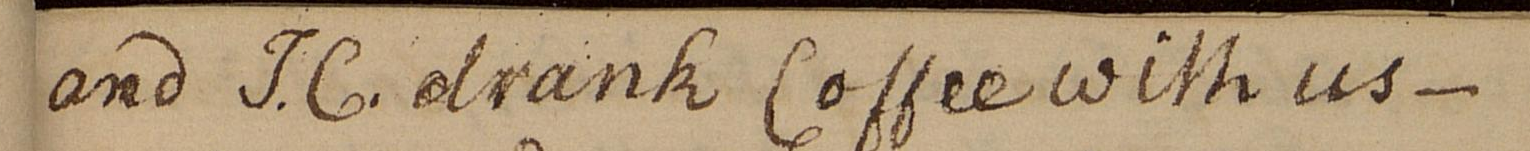and I.C. drank Coffee with us-
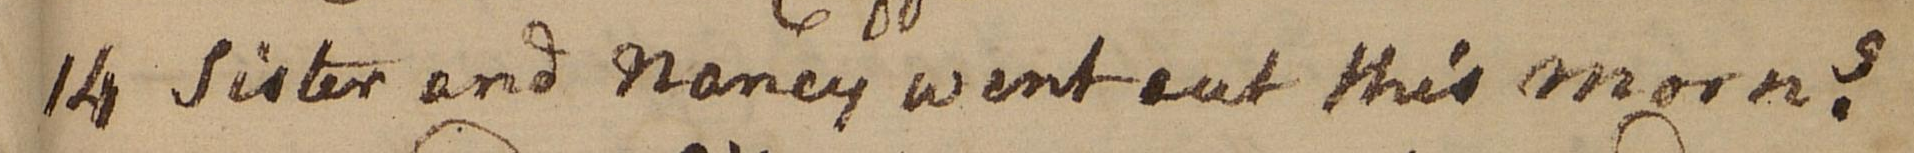14 Sister and Nancy went out this morn^g.
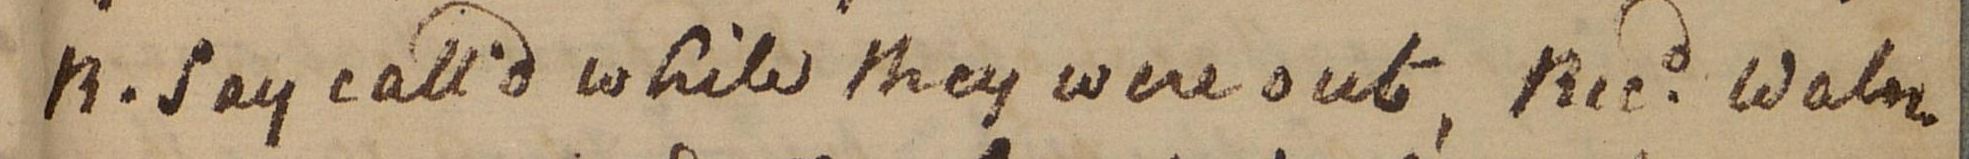R. Say call'd while they were out, Ric^d. Waln,
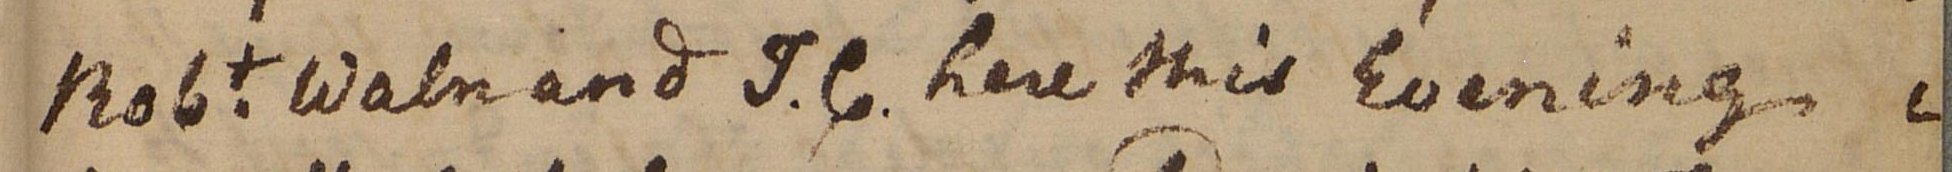Rob^t. Waln and I.C. here this Evening
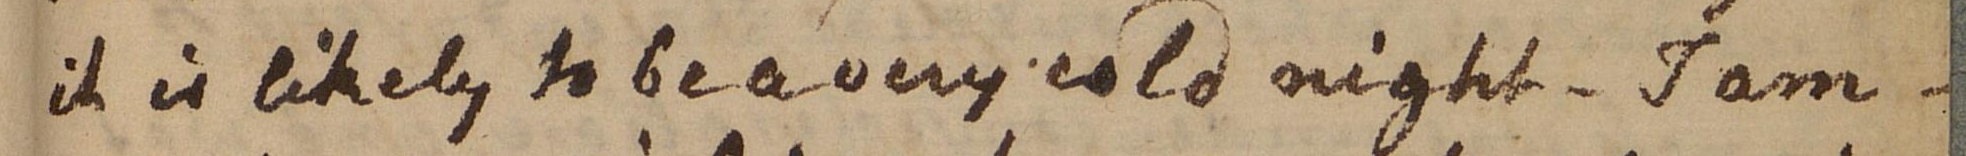it is likely to be a very cold night- I am-
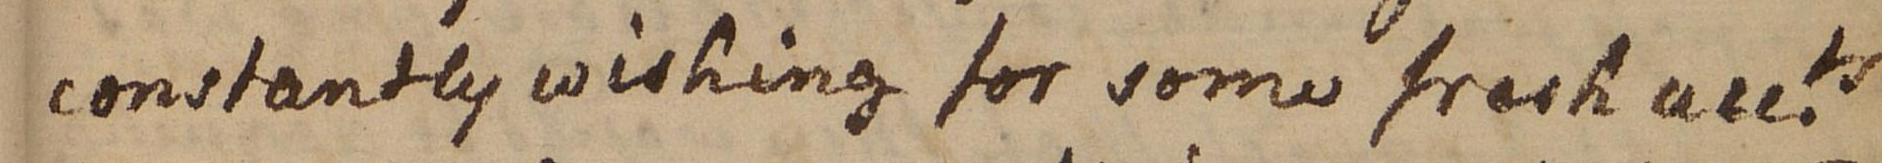constantly wishing for some fresh acc^ts.
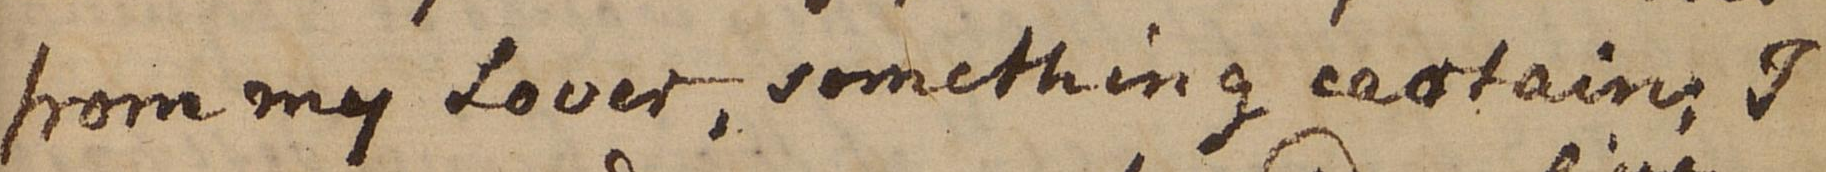from my Lover, something certain, I
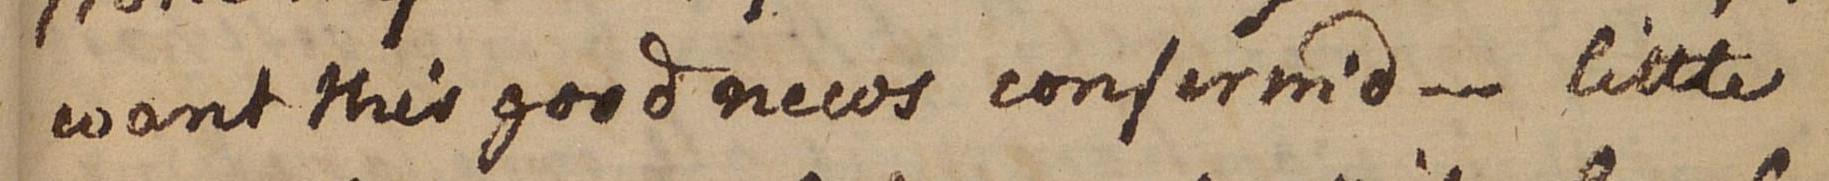want this good news confirm'd- little
